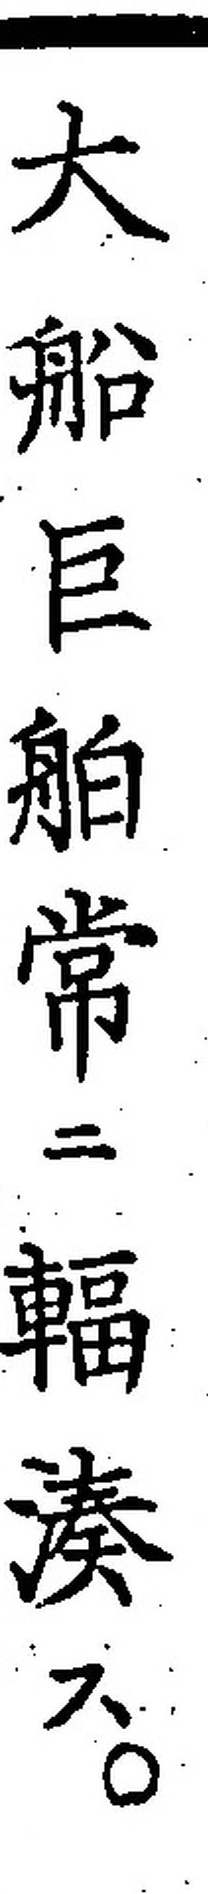大船巨舶常ニ輻湊ス。
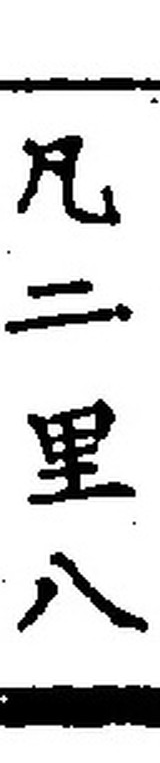凡二里八
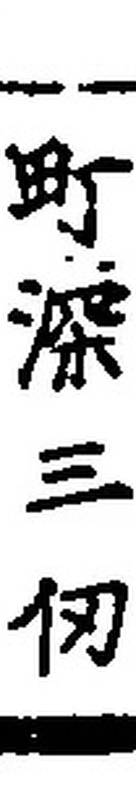町深三仞
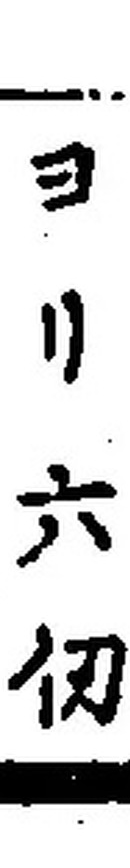ヨリ六仞
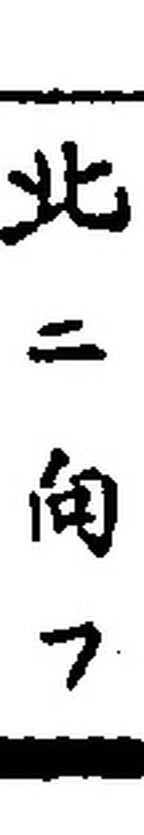北ニ向フ

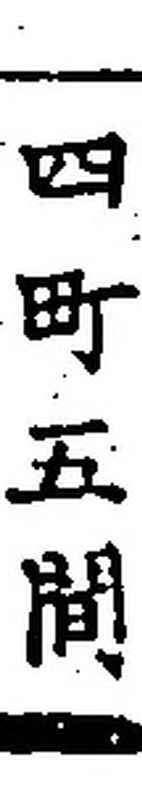四町五間
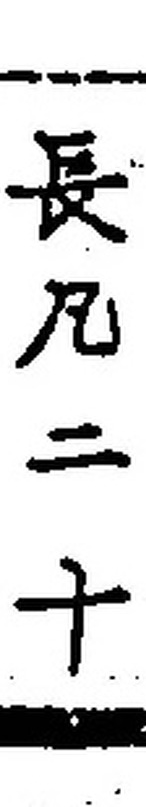長凡二十
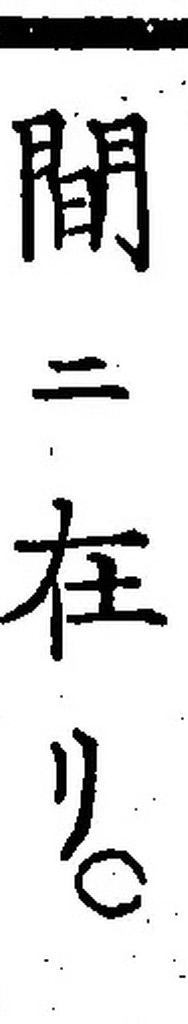間ニ在リ。
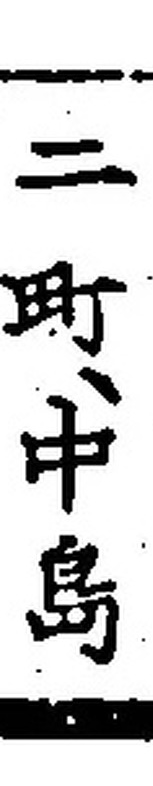二町、中島
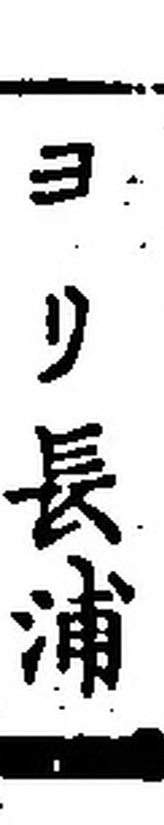ヨリ長浦
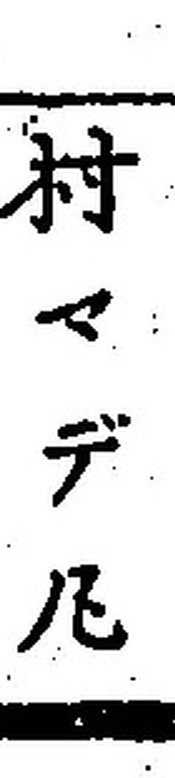村マデ凡
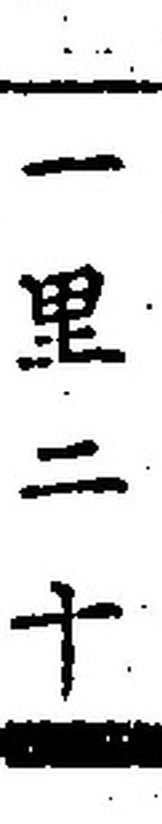一里二十
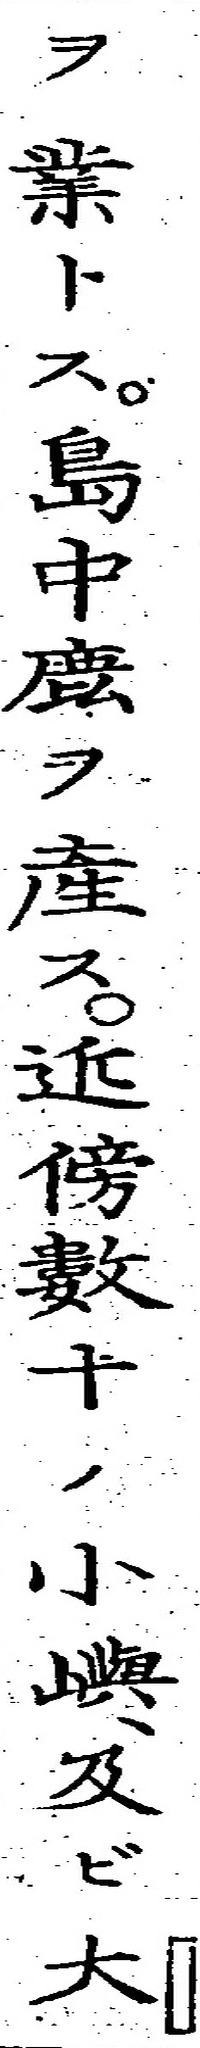ヲ業トス。島中鹿ヲ産ス。近傍数十ノ小嶼、及ビ大
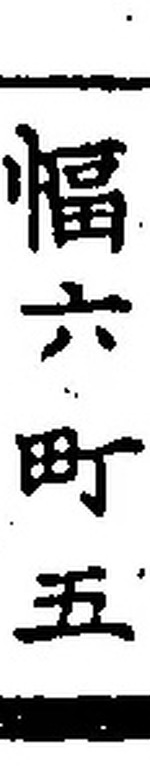幅六町五
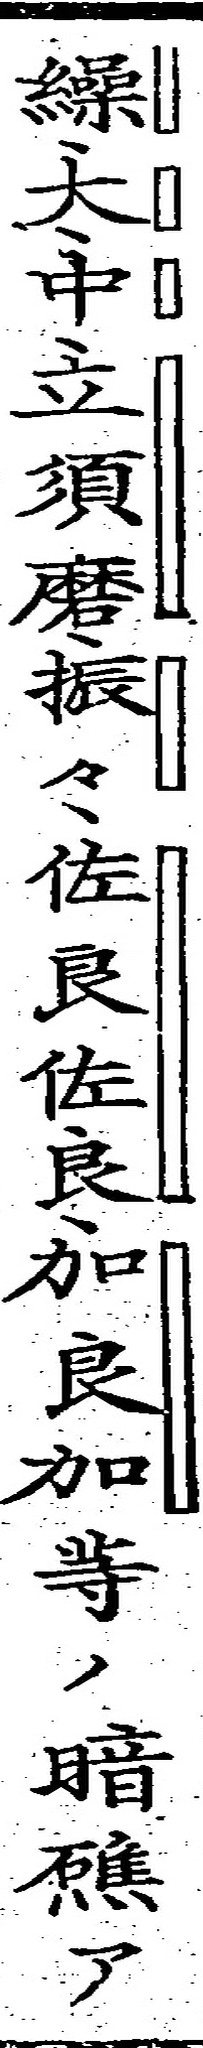繰・大・中・立須磨・振々・佐良佐良・加良加等ノ暗礁ア
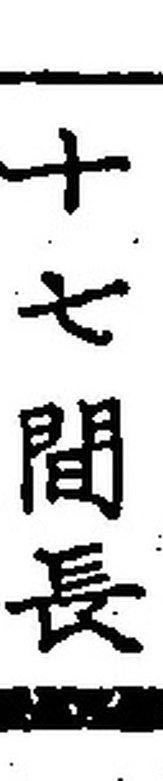十七間長
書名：能登地誌略
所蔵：国立国会図書館 National Diet Library, JAPAN
